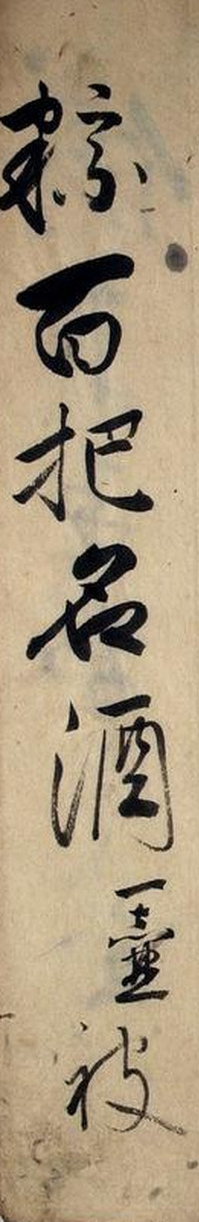粽百把名酒一壺被

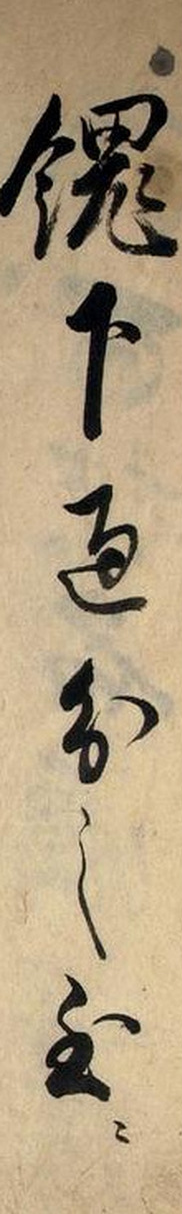餽下過分之至ニ
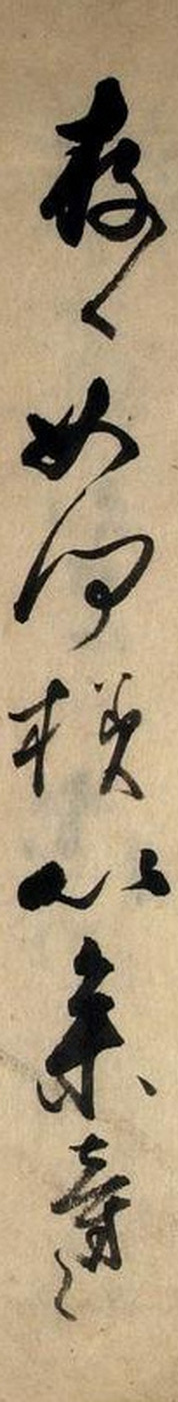存候如何様以参旁々
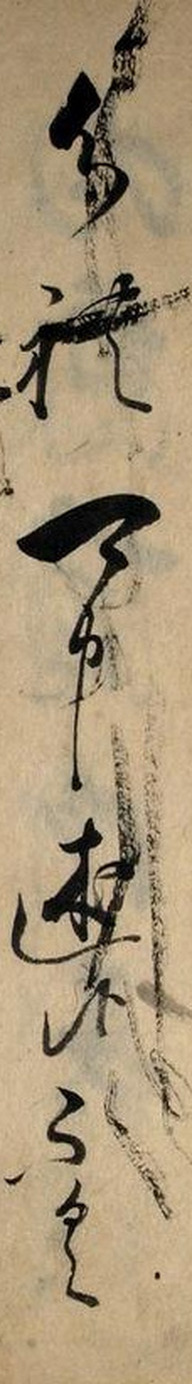御礼可申述候不具
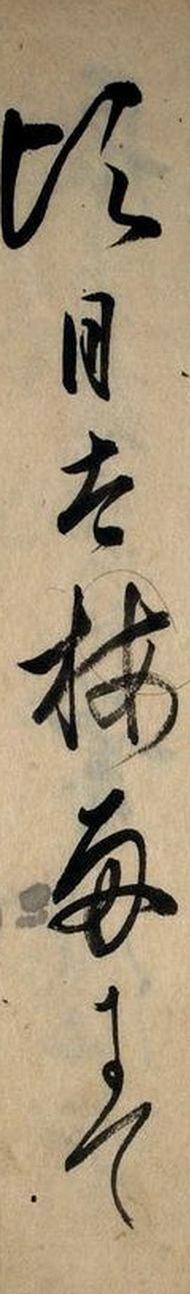頃日は梅雨にて
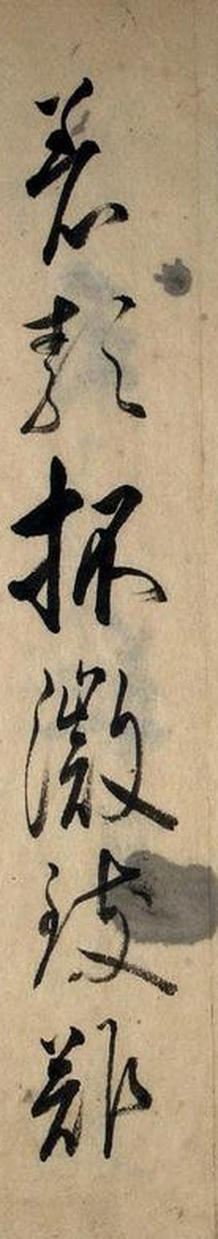着類抔微致難

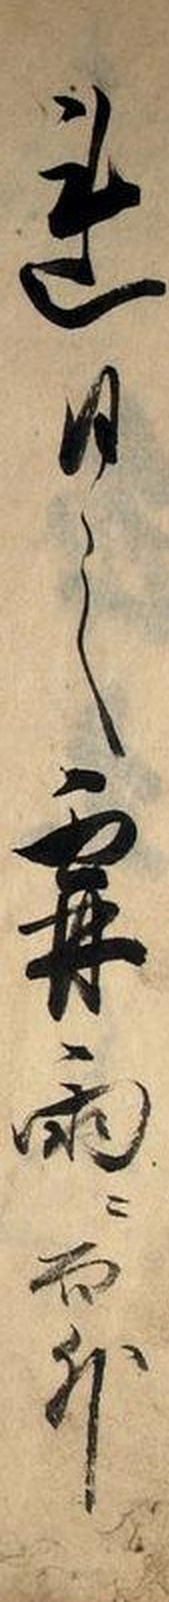連日之霖雨ニ而外
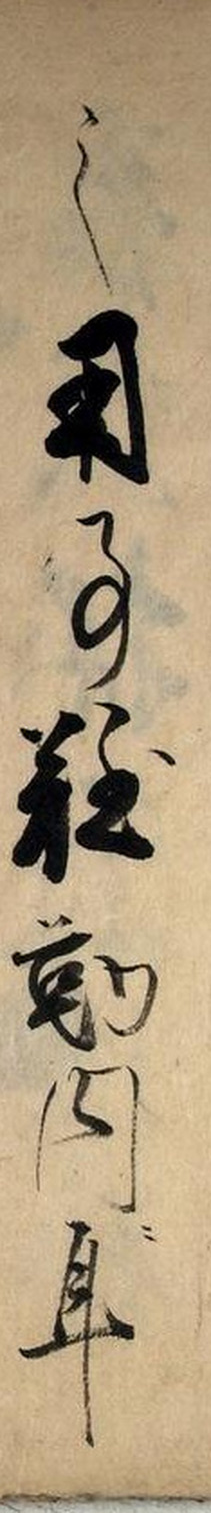之用事難勤内ニ耳
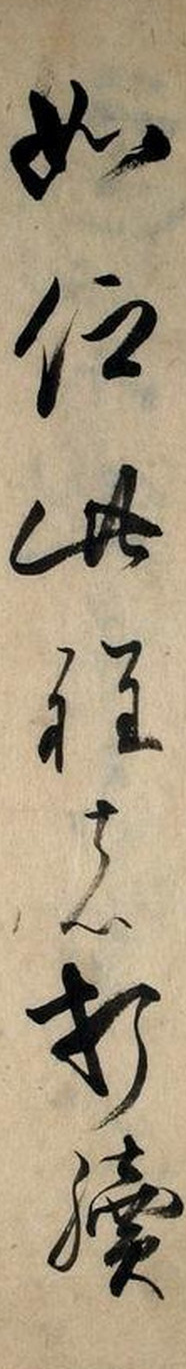如仰此程は打続
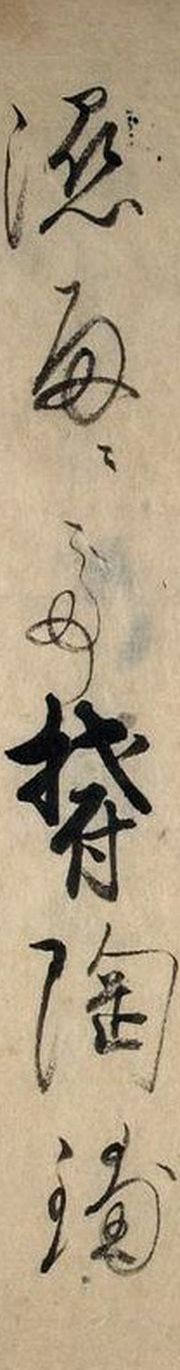濕雨ニて鬱陶鋪

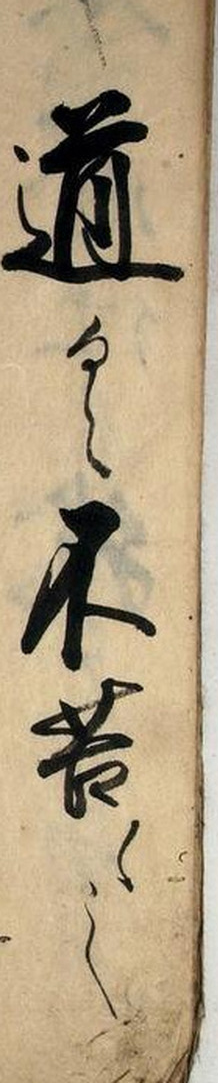之道具不苦候之
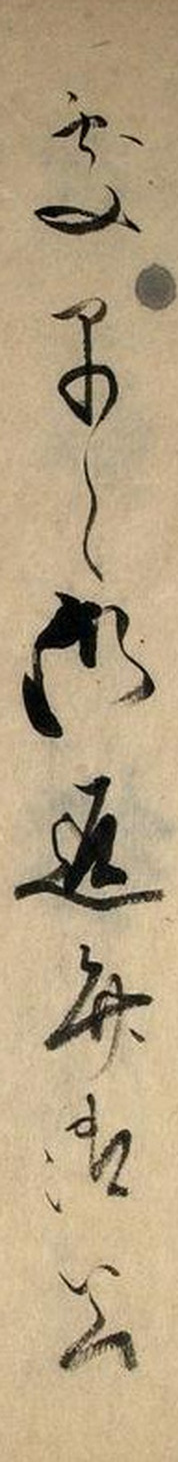処早々御返弁御公
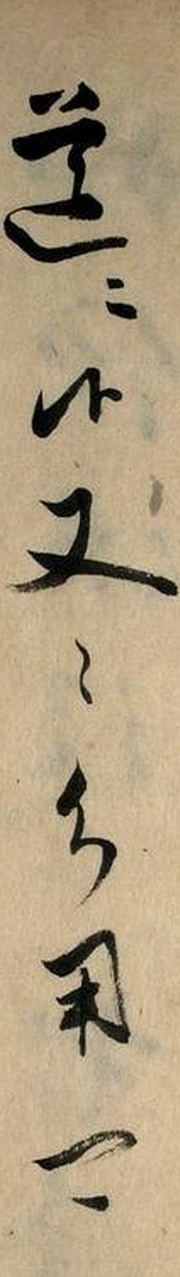道ニ候又々御用可
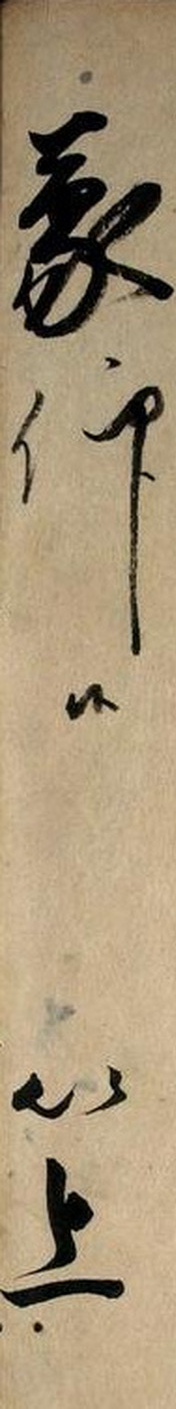蒙仰候以上
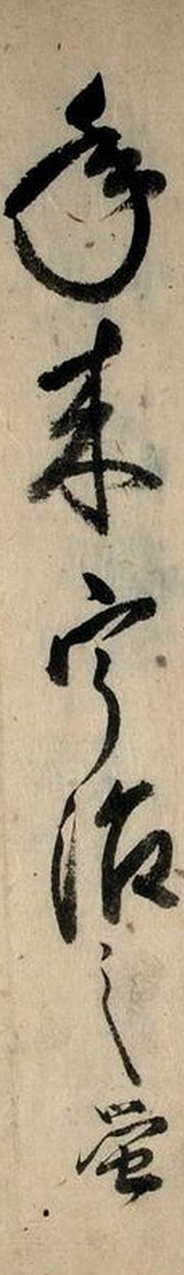年来宇治之蛍
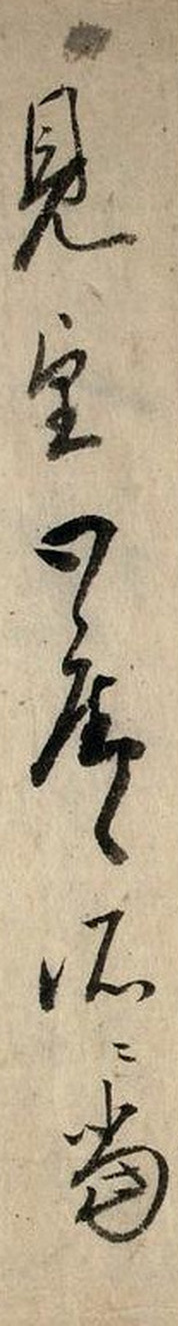見望御座候所ニ当
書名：御手本（手習、消息文、和漢朗詠集・論語の一節）
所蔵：福井県文書館 Fukui Prefectural Archives
